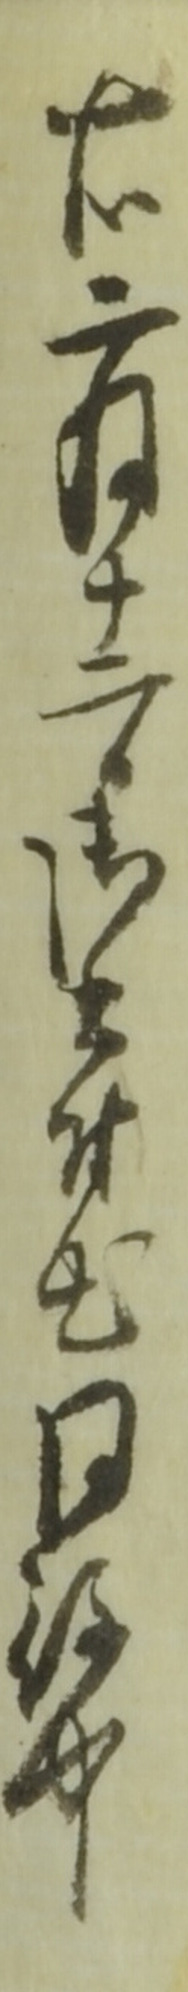右二月十二日御書付出同役中

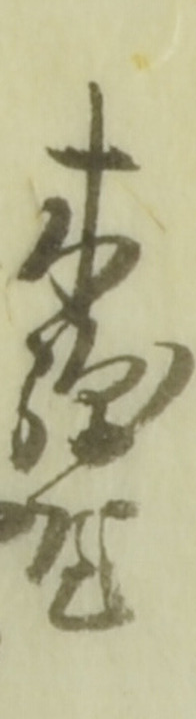木綿屋
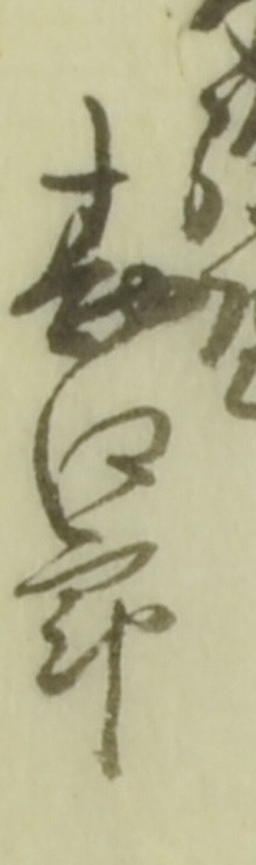勘四郎
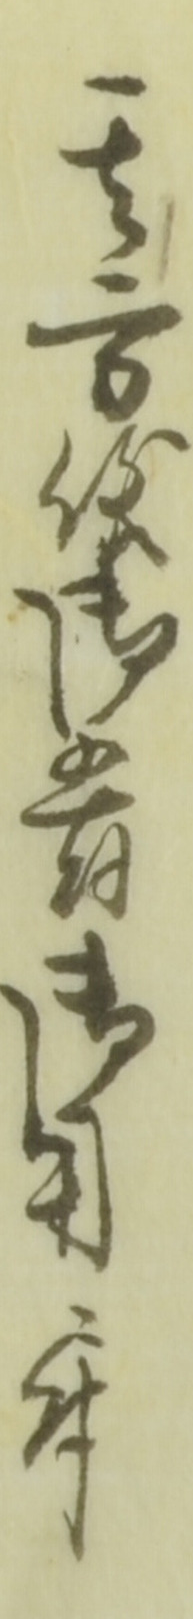其方儀御肴御用ニ付
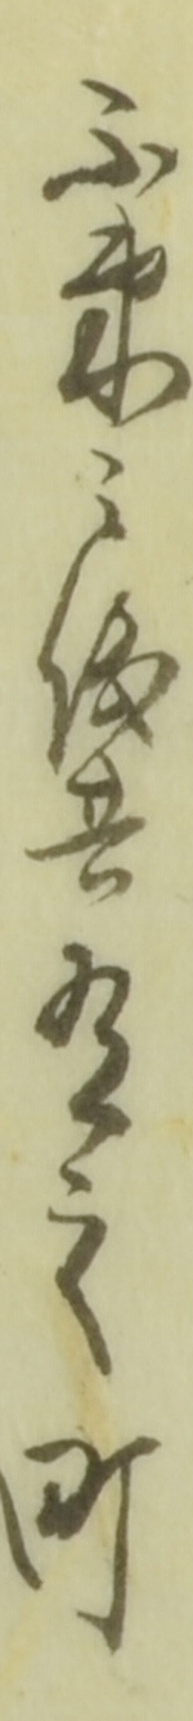不束之儀共有之町
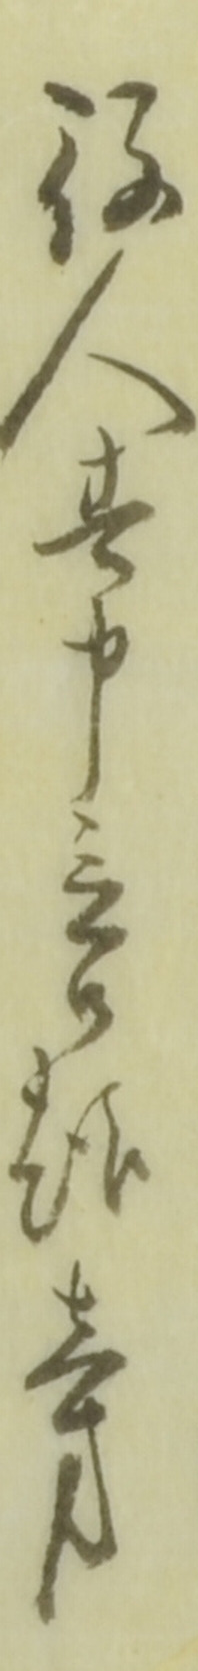役人共申言候趣旁
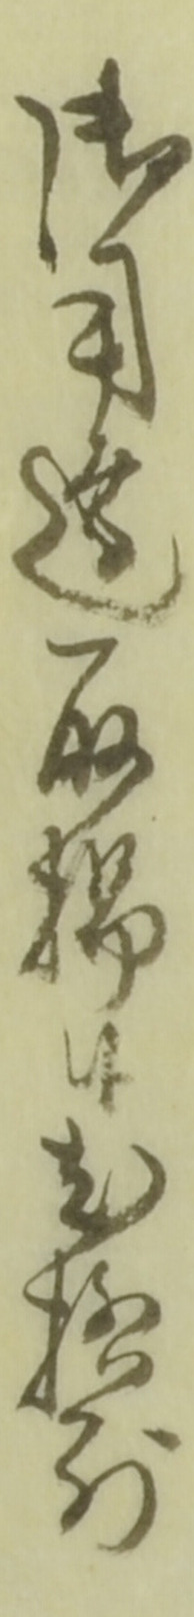御用達取揚候尤格別
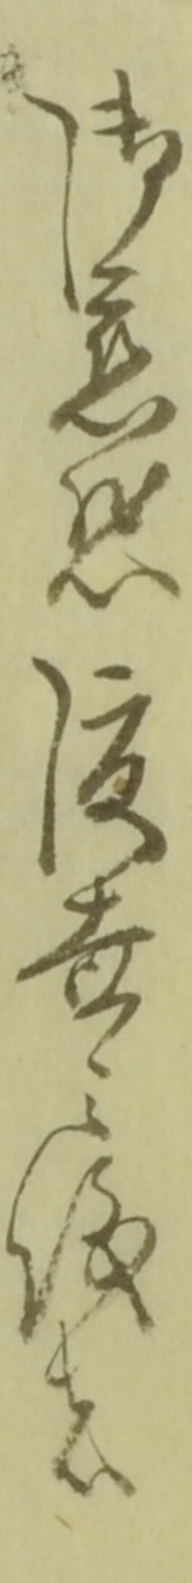御慈悲渡世之儀者
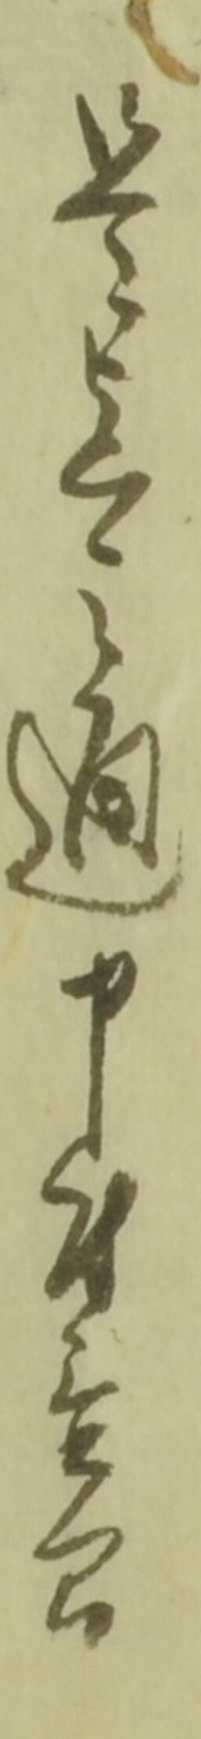是迄之通申付置間
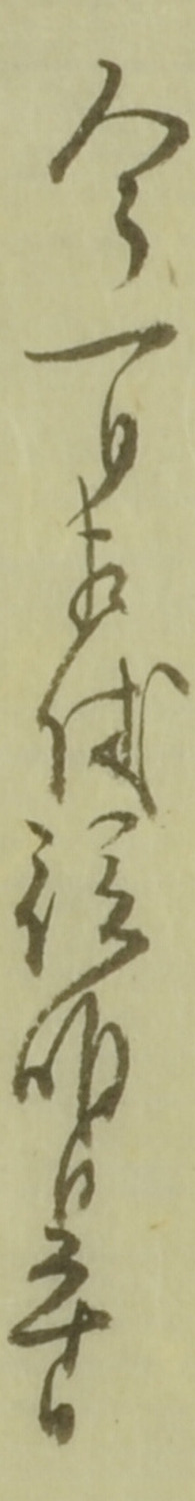今一日相休従明日午日
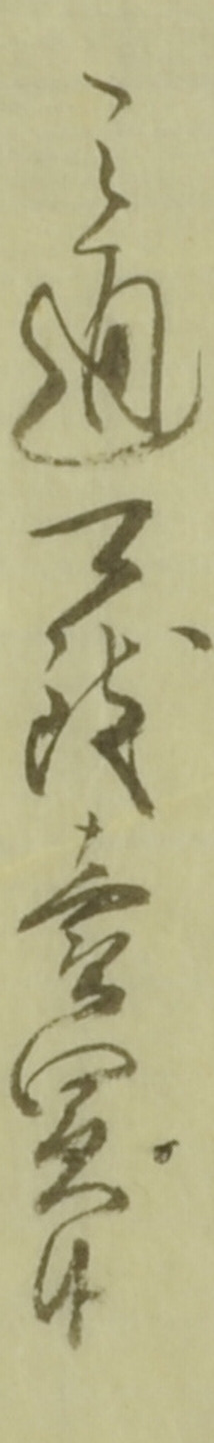之通可致売買候
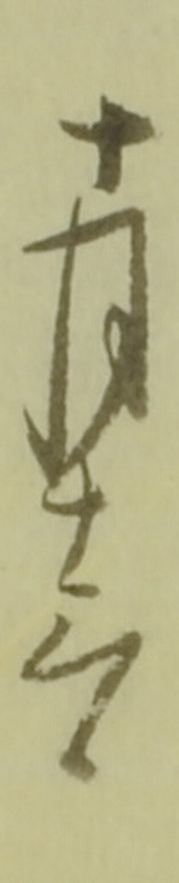十月十三日
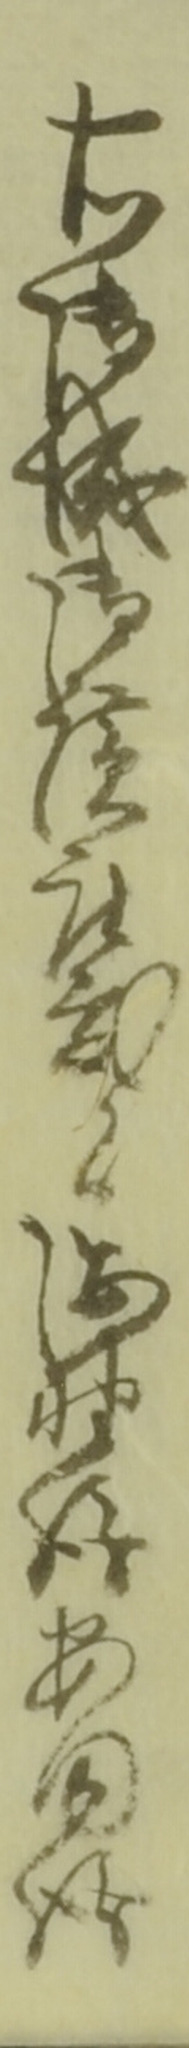右御城御候座度間浅野様安田様
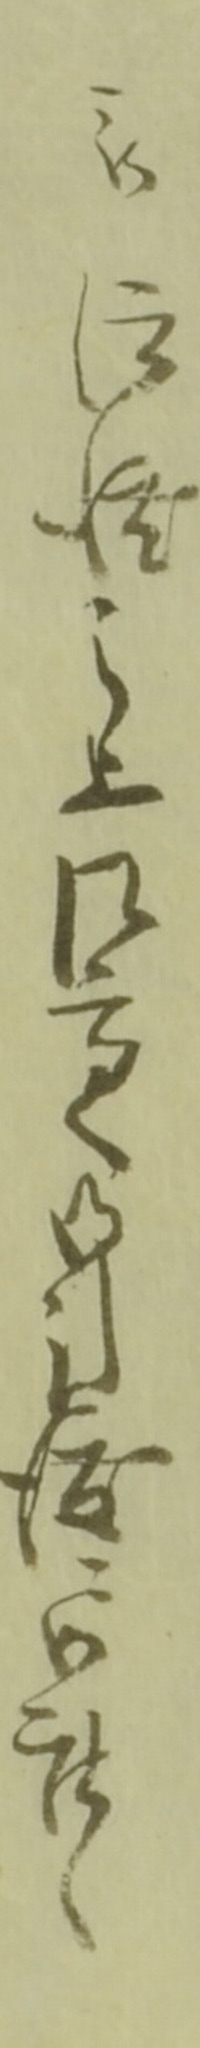被仰渡之上同意御引渡ニ御座候
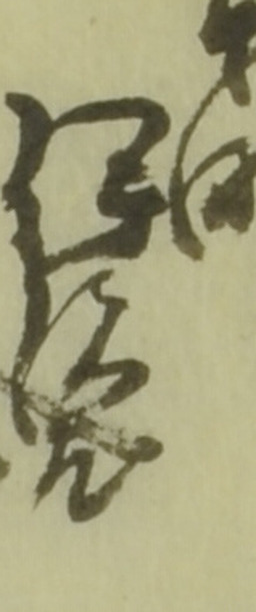伊沢屋
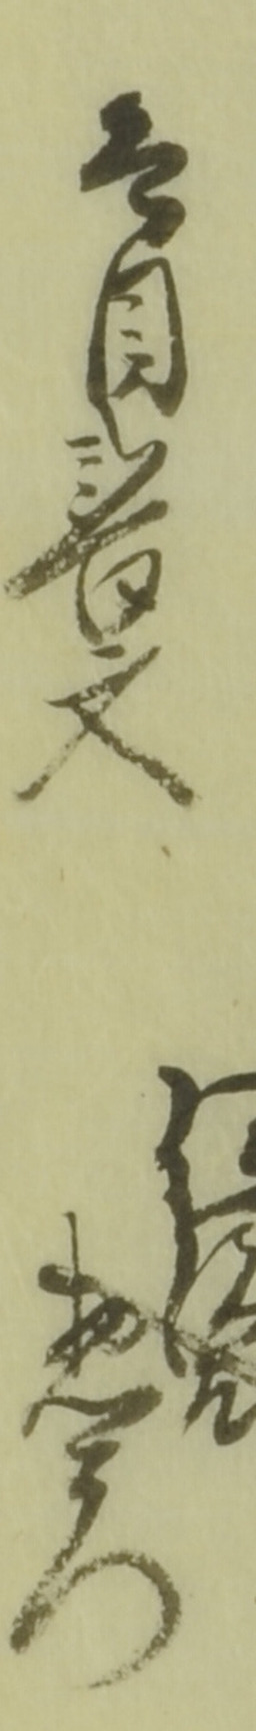鳥目弐百文惣衛門
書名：御触書御書附控
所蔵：伊那市立高遠町図書館・合同会社AMANE
